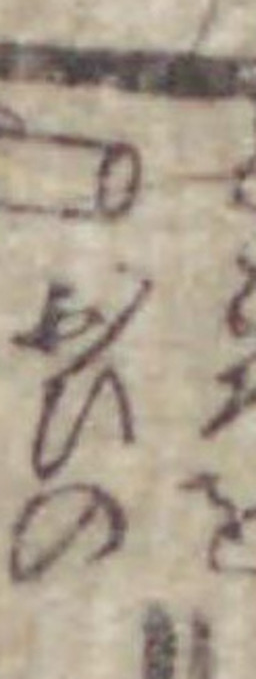おひの
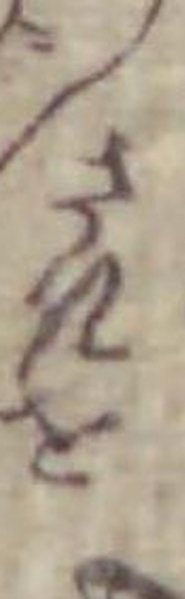さきを
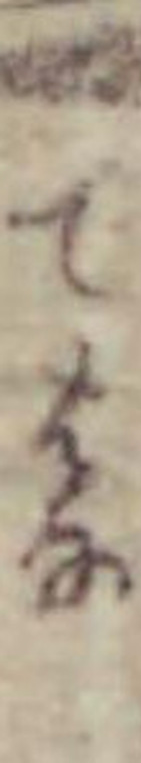てはな
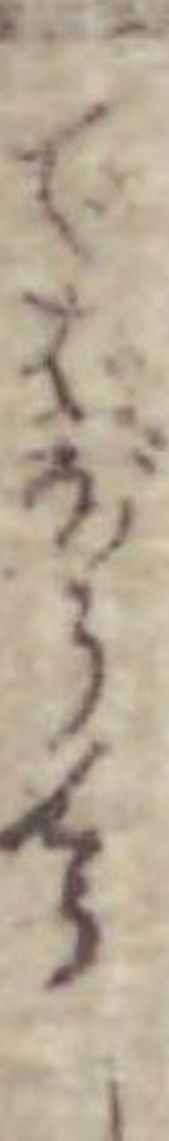でばぼうてう
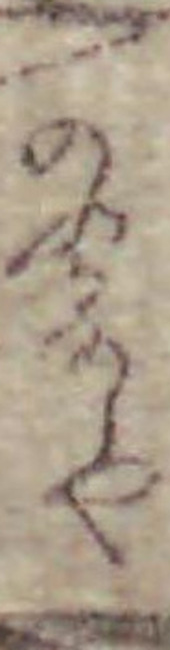のふかなしや
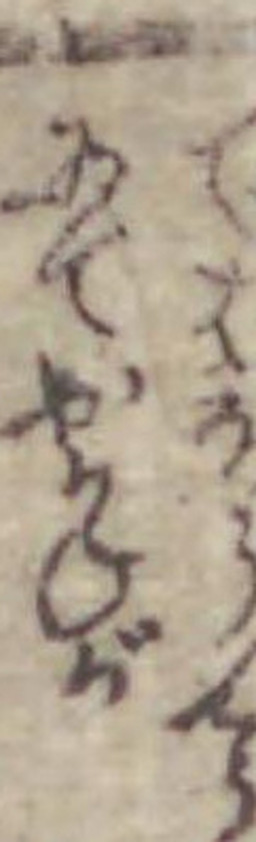にておかねが
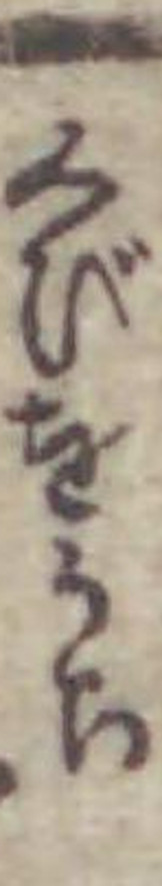くびをうち
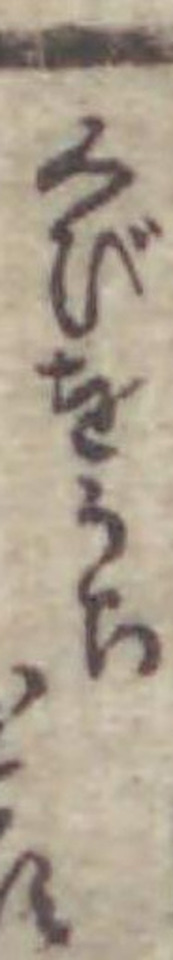くびをうち
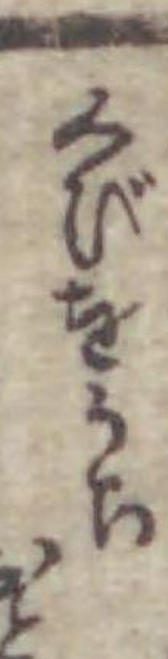くびをうち
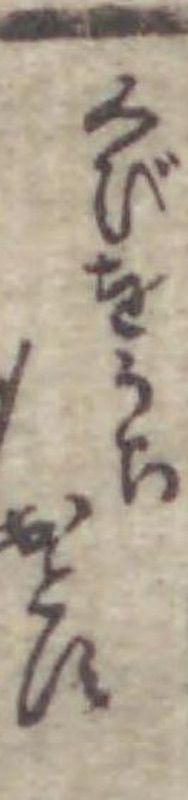くびをうち
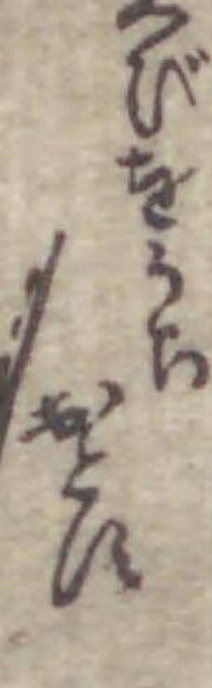おとす

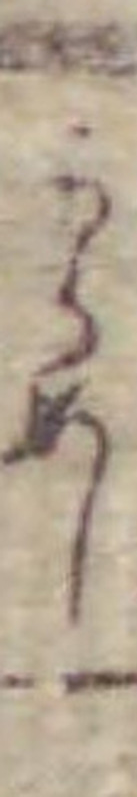うらめし
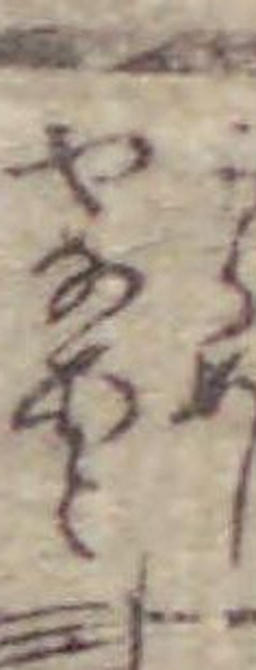やなあと
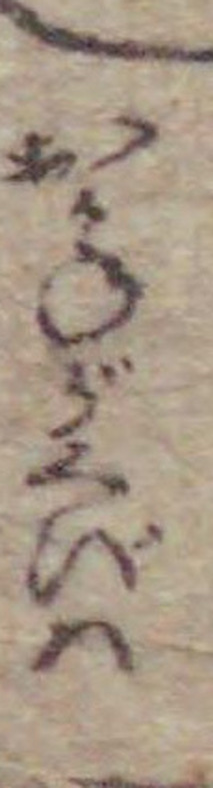おかねがくびは
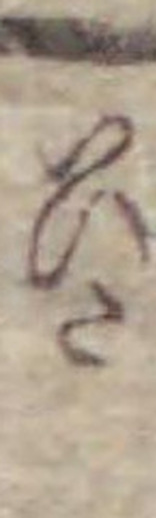いひた
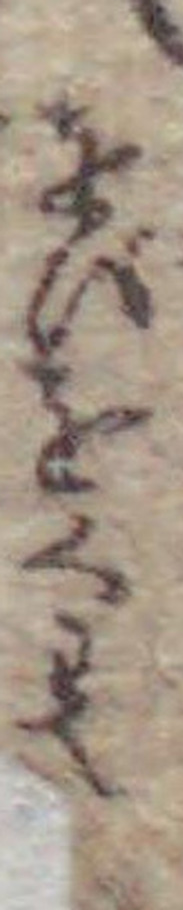をびをくわへ
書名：嗚呼不侭世之助噺 : 3巻
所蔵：国立国会図書館 National Diet Library, JAPAN
